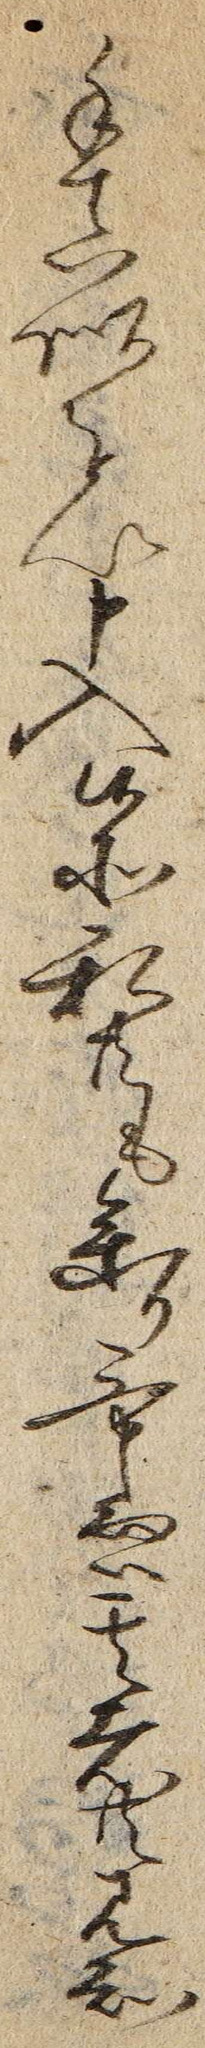手真似を以申入候所私どもも参り不申ては其者ども見知

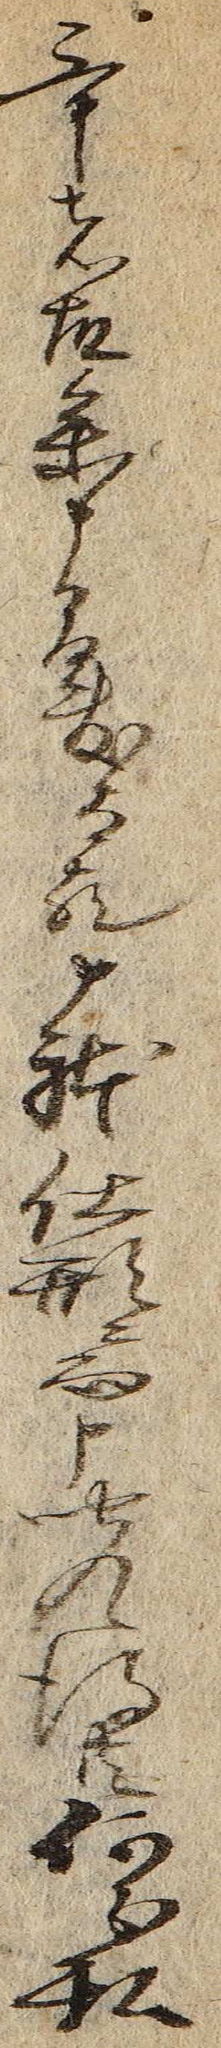不申者故参申まじくとか申体仕形にて申聞候得ども何分私
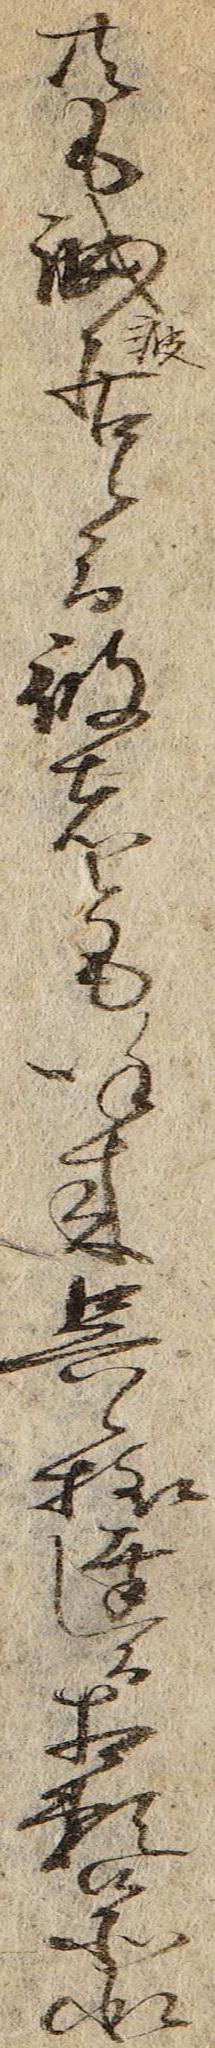どもも誠疲居候間彼者とも呼来呉候様達て相頼候所承
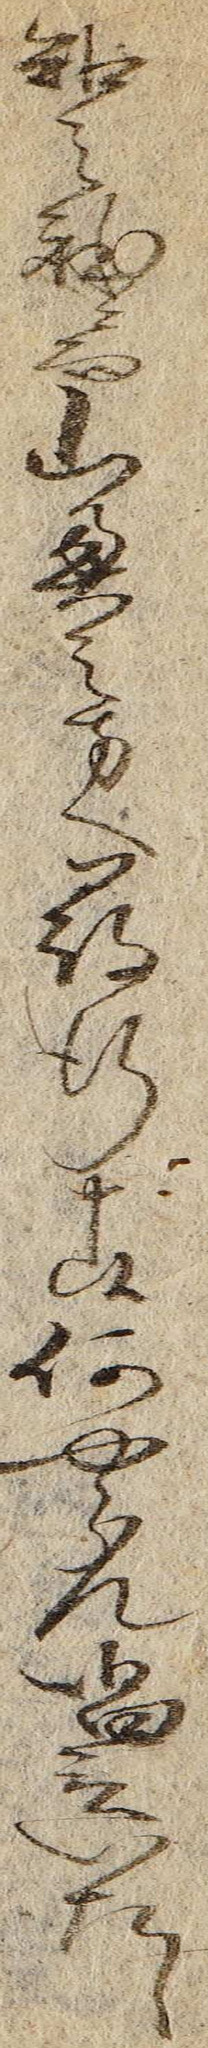知の体にて山奥の方へ尋行申候何やらん唱言いたし
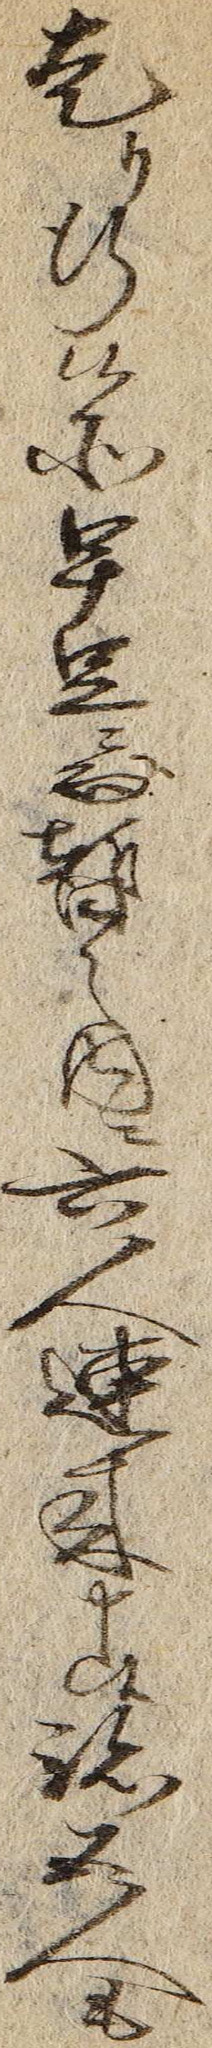走り行候所早足にて暫の内に六人連来申候跡五人も
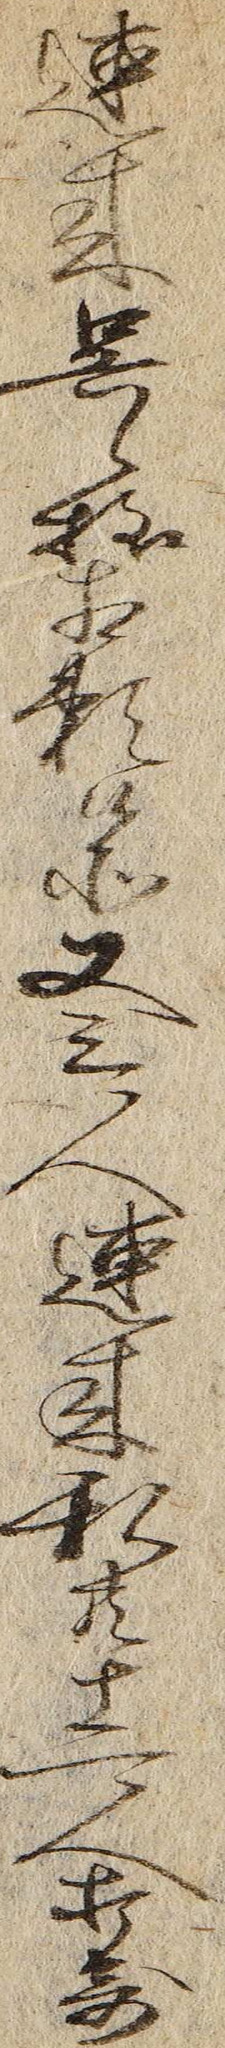連来呉候様相頼候所又三人連来私ども十二人打寄
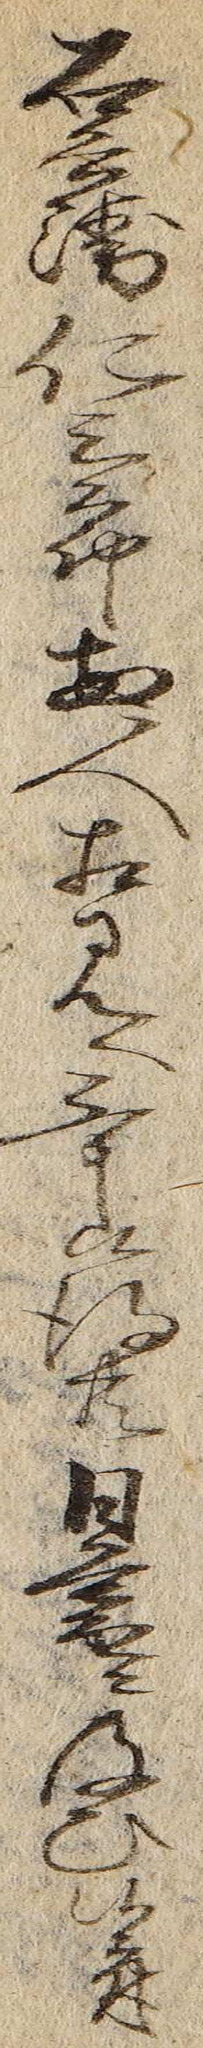石兵衛仁三郎両人相見へ不申候得ども日暮に及ひ候に付
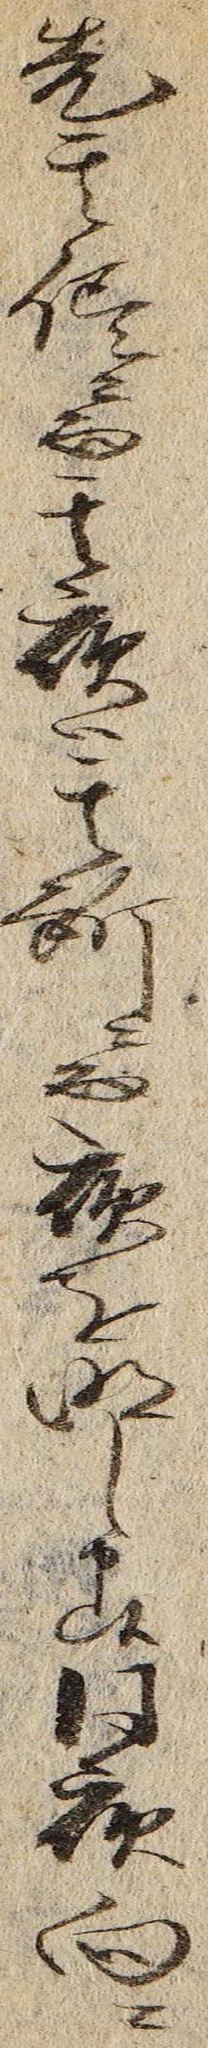先其侭にて其夜は其所にて夜を明し申候同夜向に
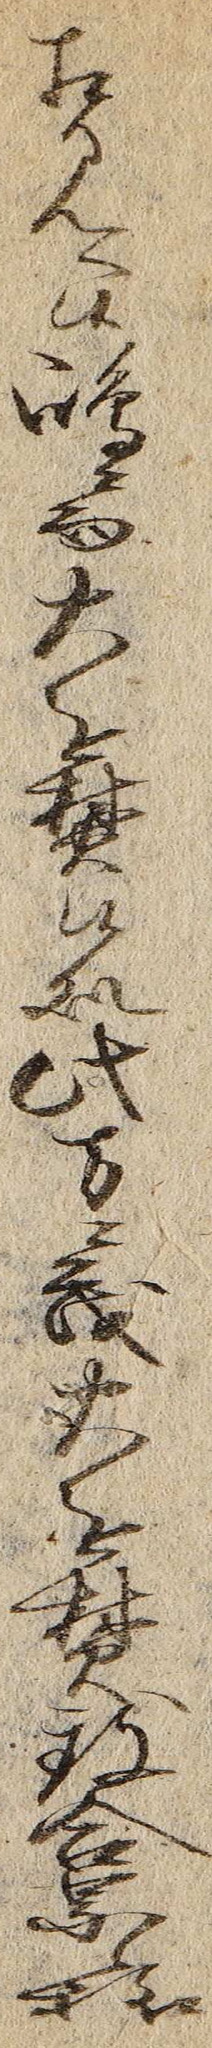相見へ候島にて火を焚候処此方にも火を焚致合図様
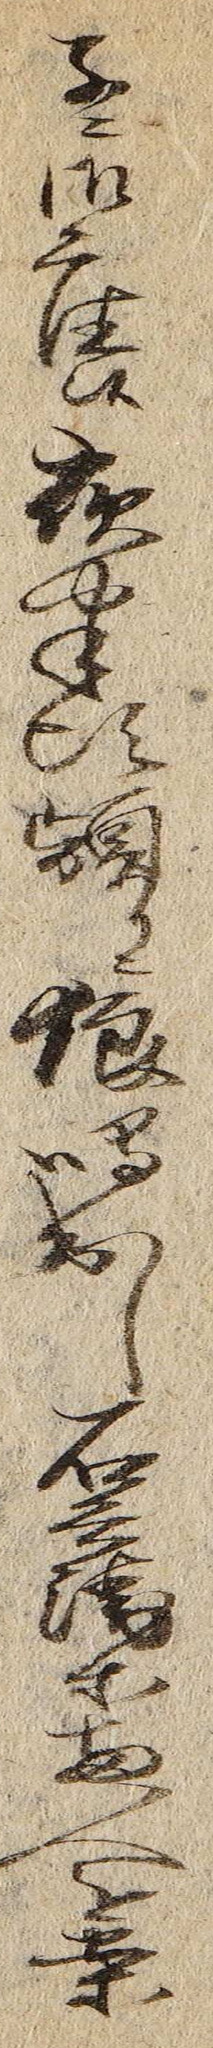子に御座候夜半頃頻りに狼鳴出し石兵衛等両人を案
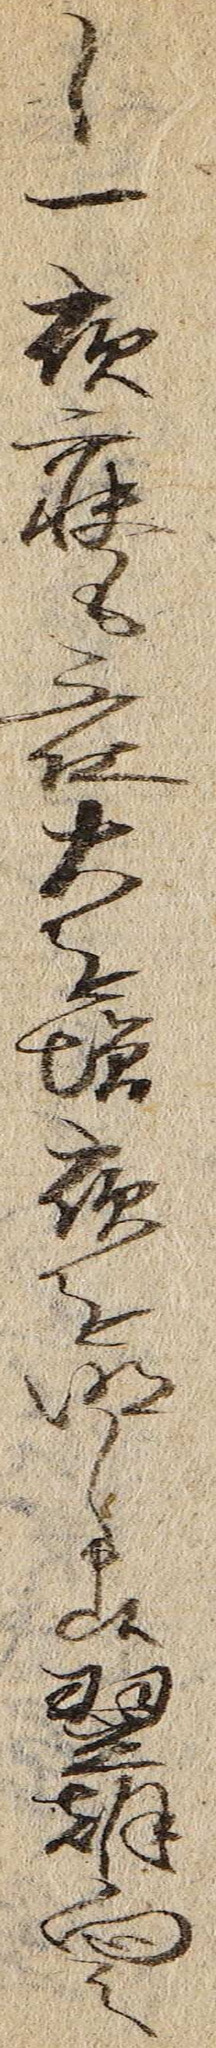し一夜寝も不仕火を増夜を明し申候翌朝向の
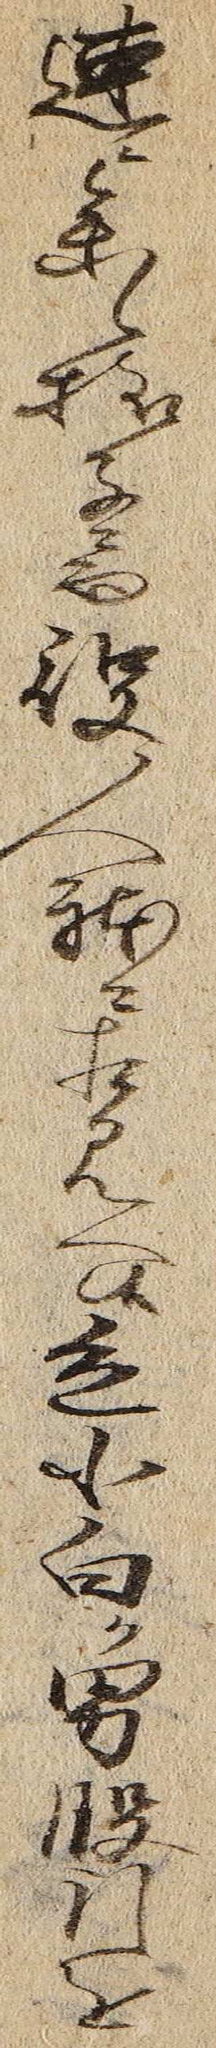連に参候様子にて役人体に相見へ候色小白く男股引を
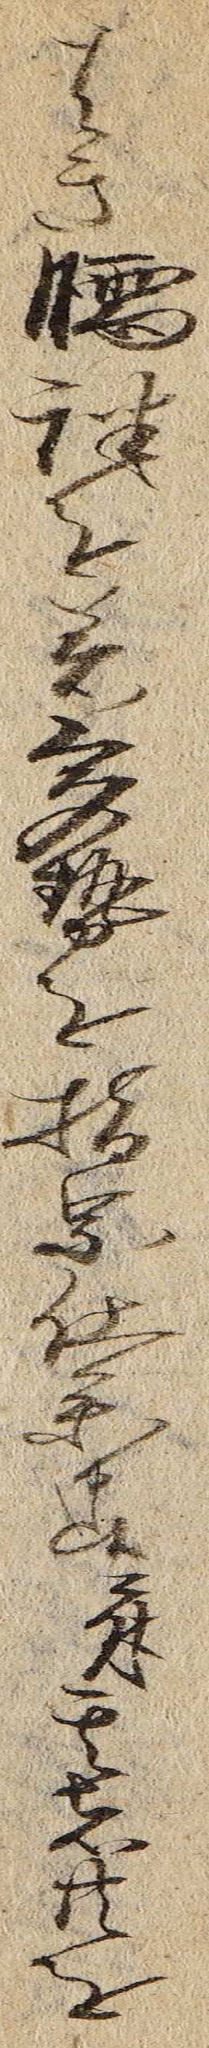はき襦袢を着多勢を指図仕参申候に付其者どもを
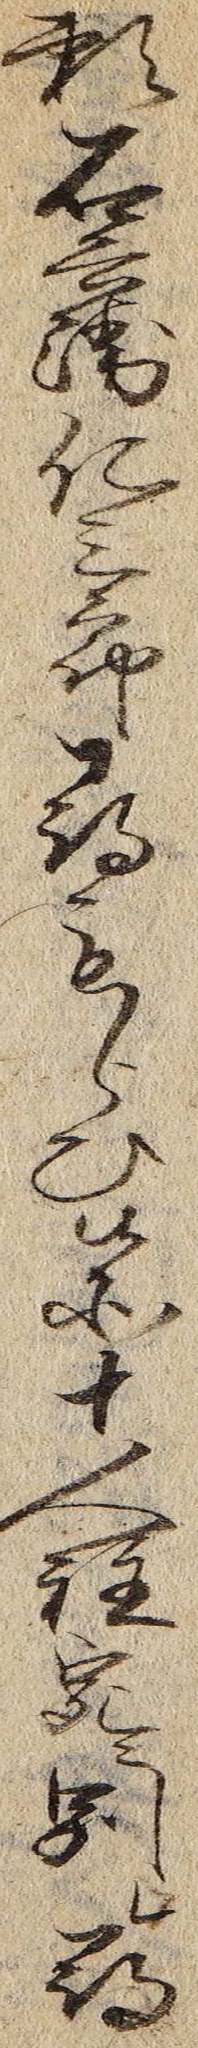頼石兵衛仁三郎尋もらひ候処十人程ずつに別れ尋
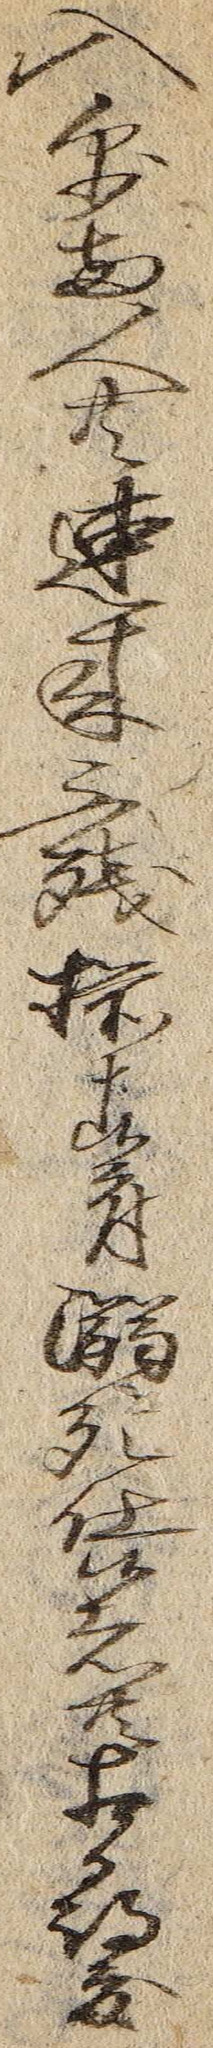入余両人とも連来不残揃申候に付溺死仕候者ども相尋たく
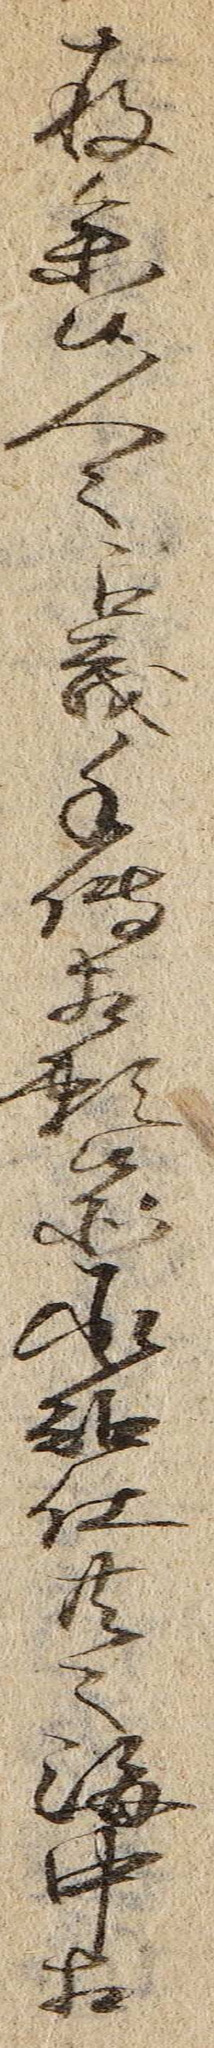存参候人々へも手伝相頼候所承知仕共々海中相
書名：能登国清兵衛異国江漂流之始末
